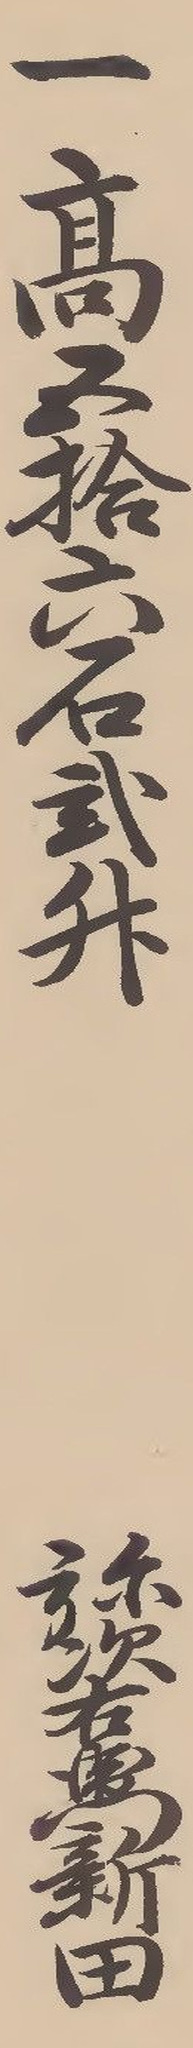一高五拾六石弐升弥次右衛門新田
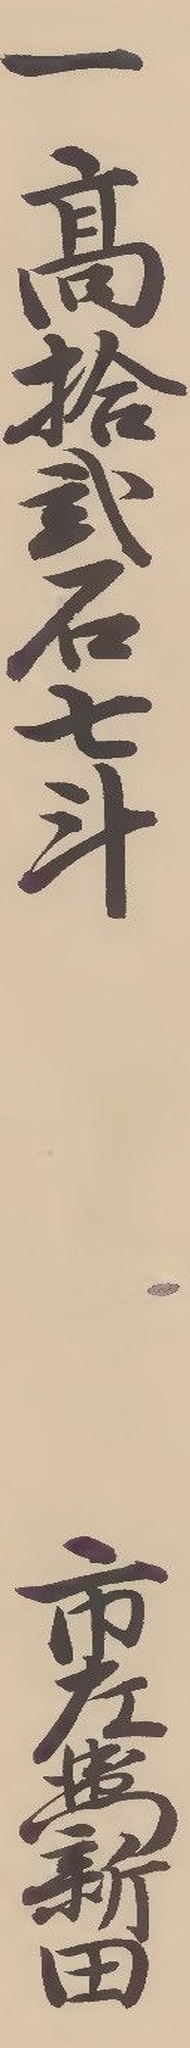一高拾弐石七斗市左衛門新田

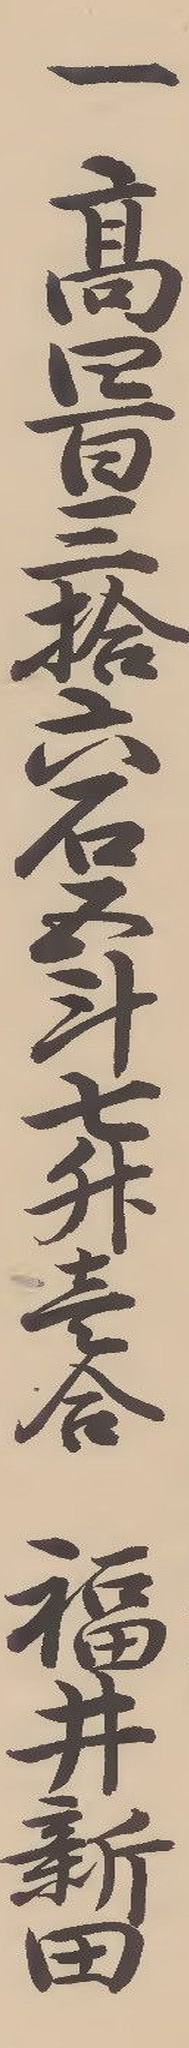一高四百三拾六石五斗七升壱合福井新田
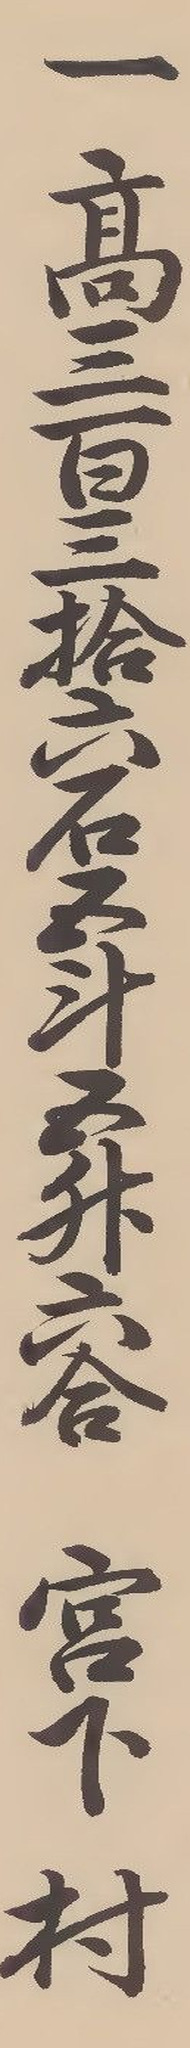一高三百三拾六石五斗五升六合宮下村
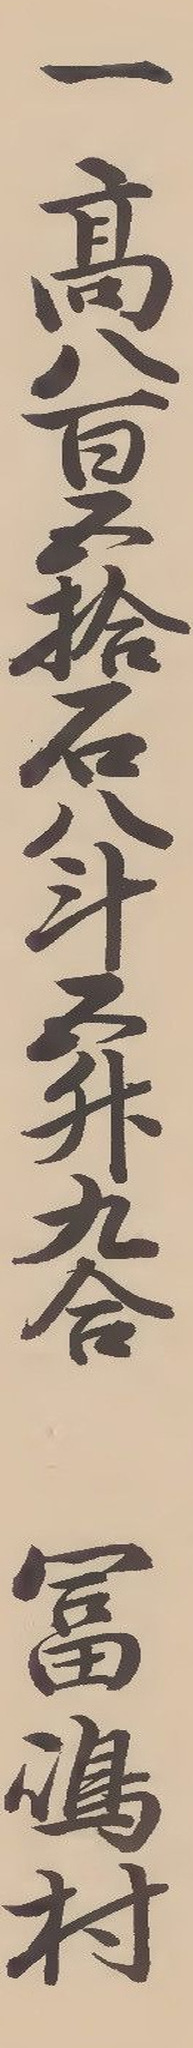一高八百五拾石八斗五升九合富島村
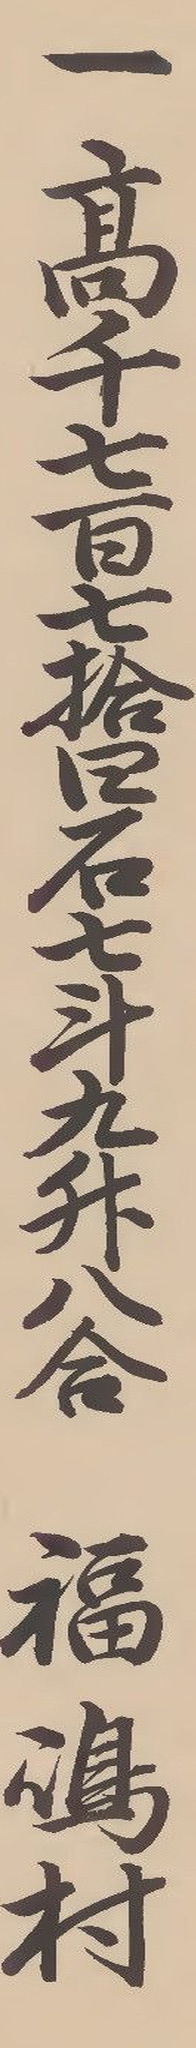一高千七百七拾四石七斗九升八合福島村
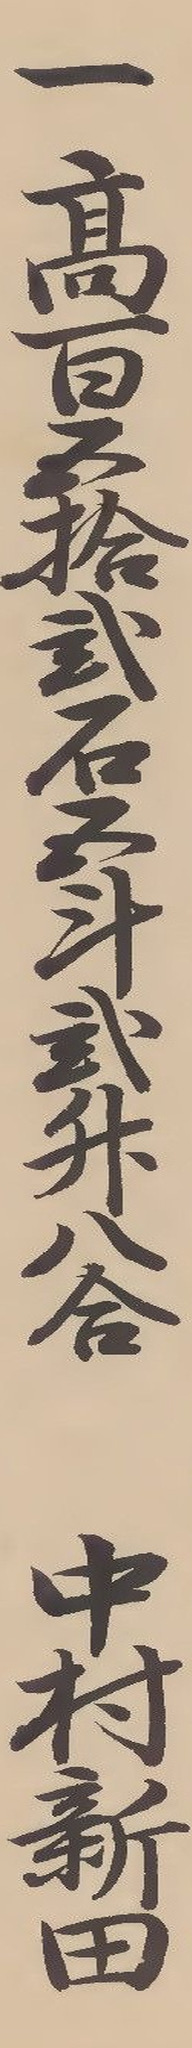一高百五拾弐石五斗弐升八合中村新田
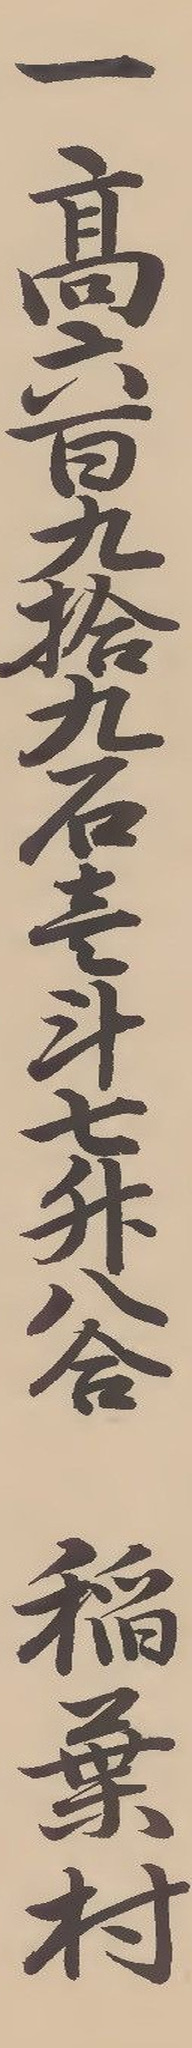一高六百九拾九石壱斗七升八合稲葉村
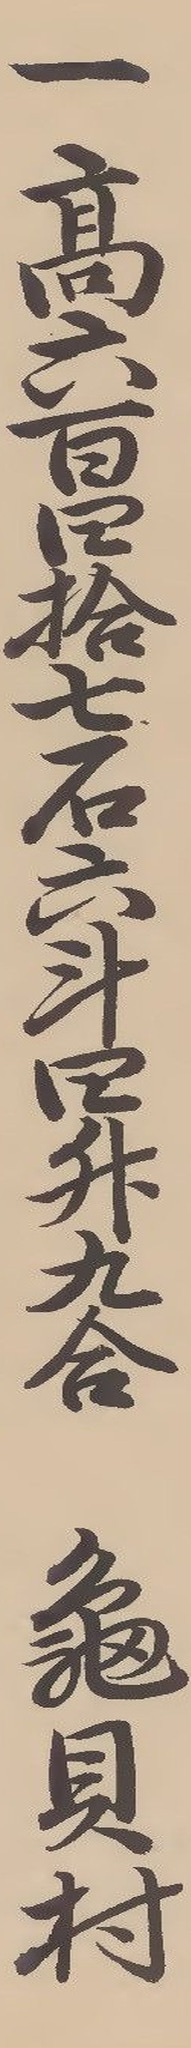一高六百四拾七石六斗四升九合亀貝村
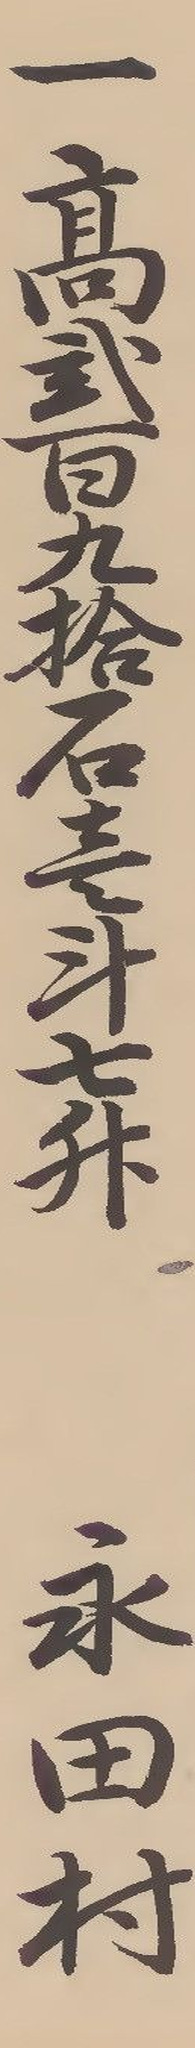一高弐百九拾石壱斗七升永田村

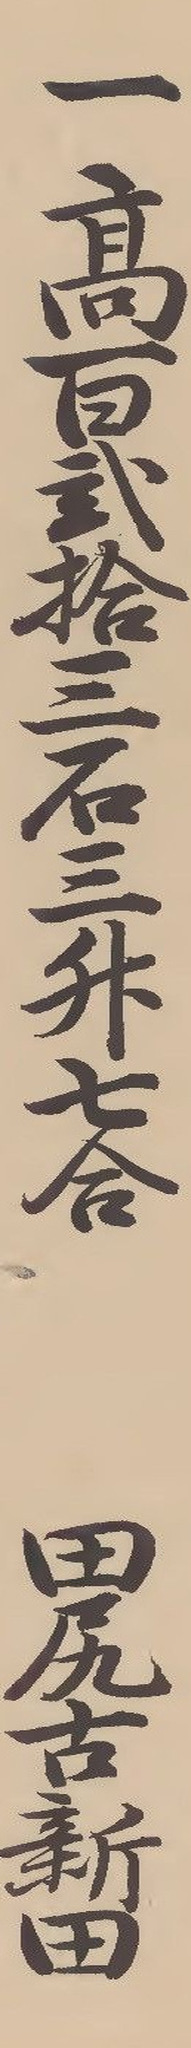一高百弐拾三石三升七合田尻古新田
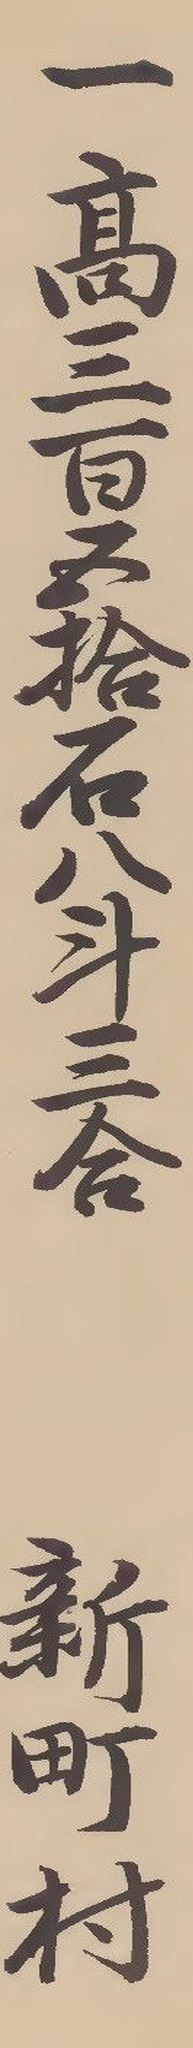一高三百五拾石八斗三合新町村
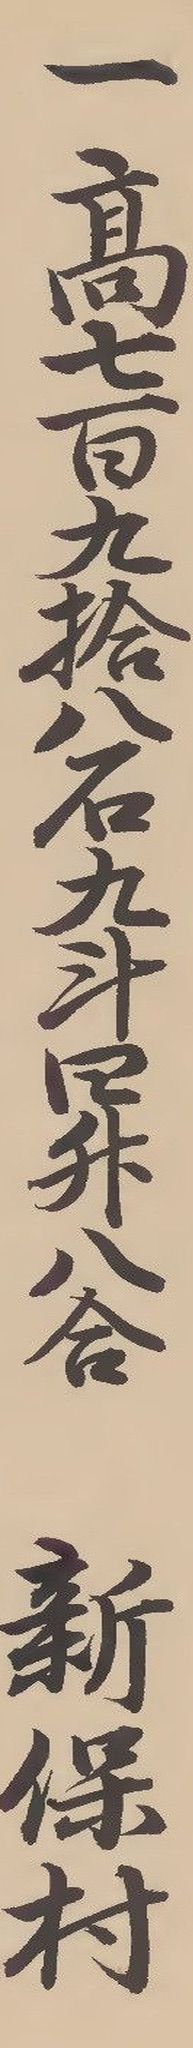一高七百九拾八石九斗四升八合新保村
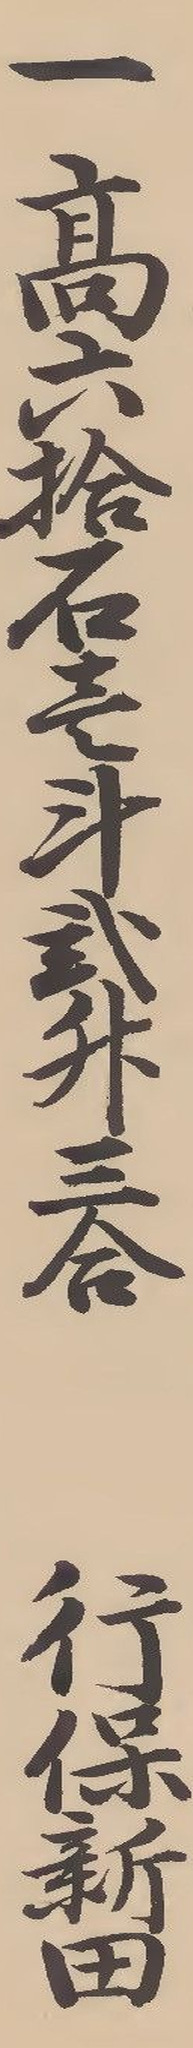一高六拾石壱斗弐升三合行保新田
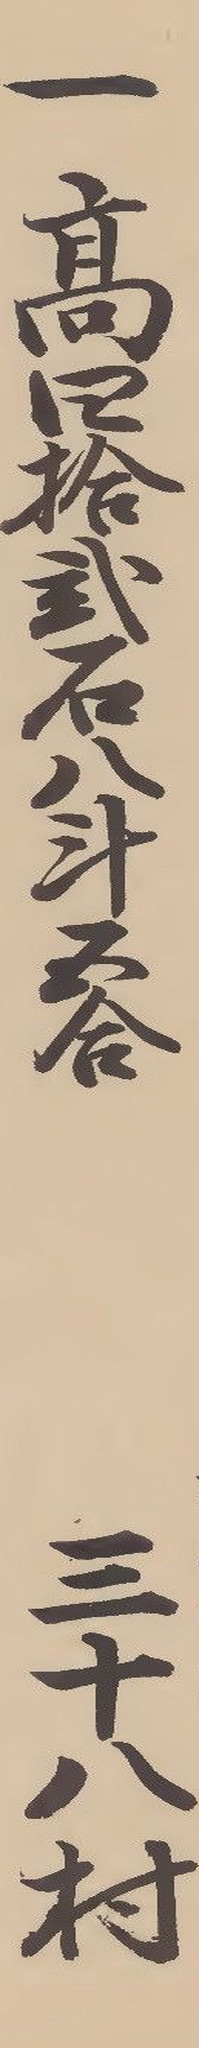一高四拾弐石八斗五合三十八村
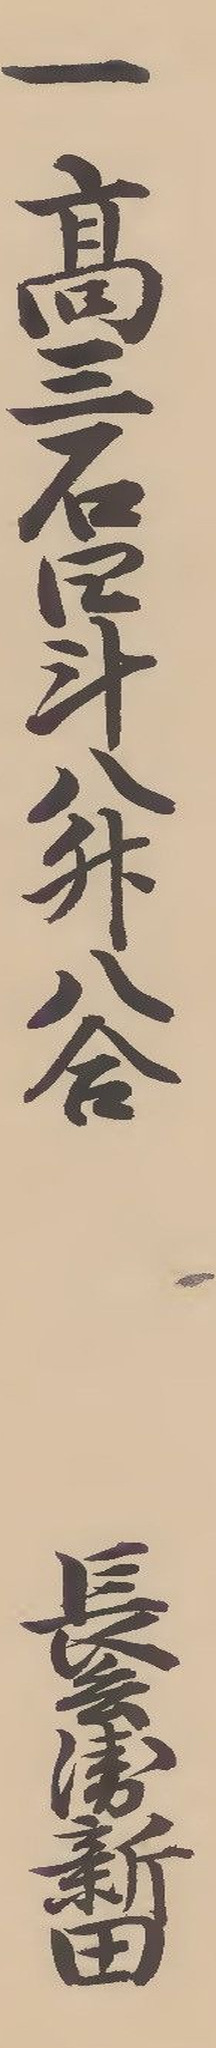一高三石四斗八升八合長兵衛新田
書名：越後国郷帳　中
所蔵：国立公文書館 National Archives of Japan
